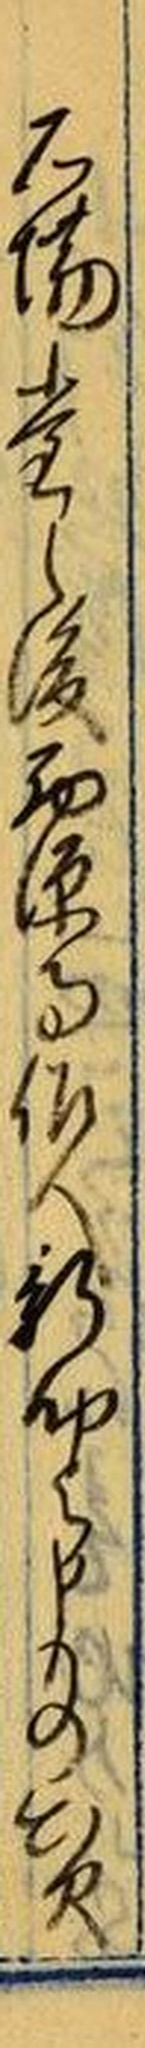石場堂之後西源寺住人新助と申もの出火
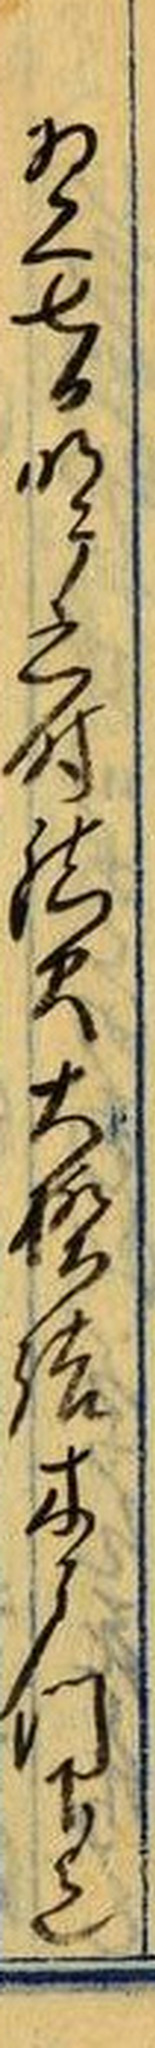翌七日明ヶ六時鎮火大橋詰木戸門下迄
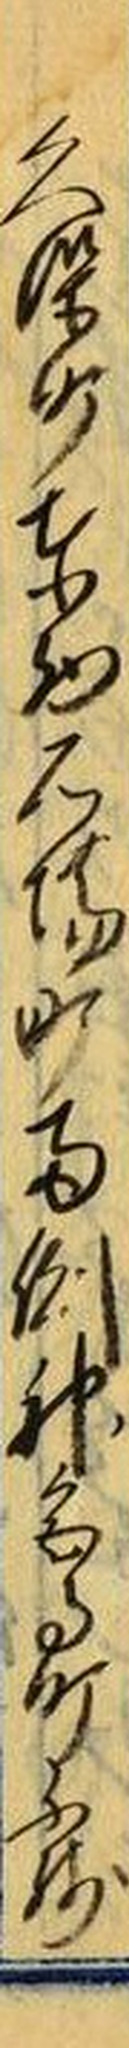久保町東西石場町両側神宮寺町不残
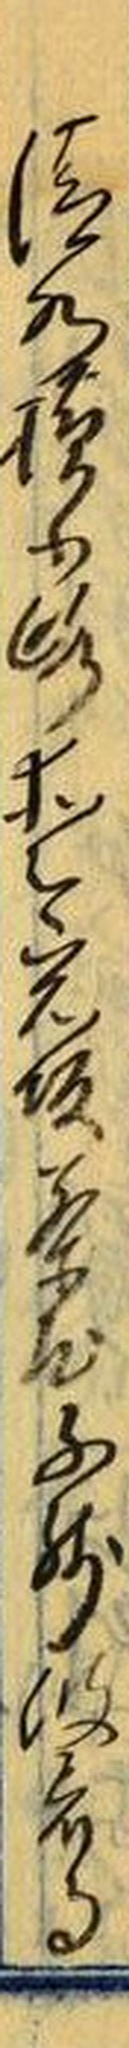清水横小路愛宕坂茶屋不残彼岸寺
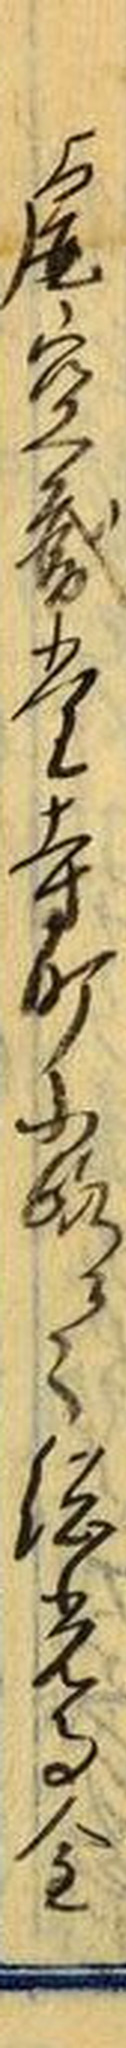虚空蔵堂寺町小路ニて総光寺金
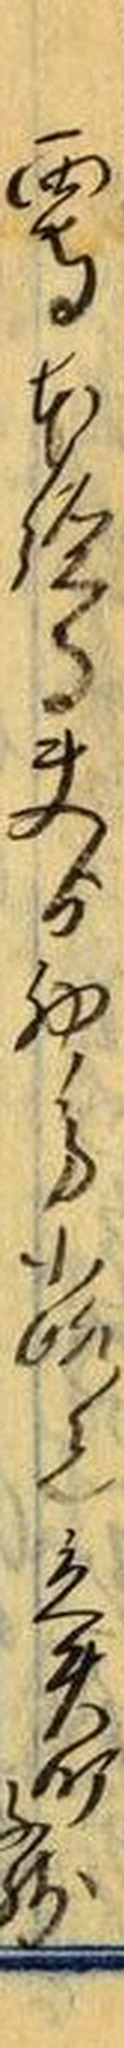西寺本経寺夫ゟ西ノ方小路迄立矢町不残
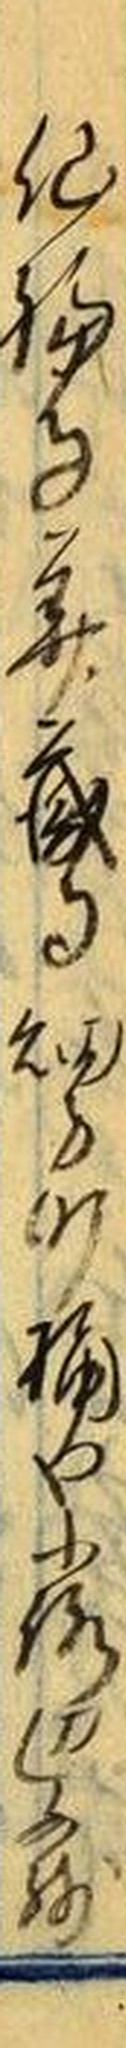仙福寺華蔵寺畑方町桶や小路辺不残
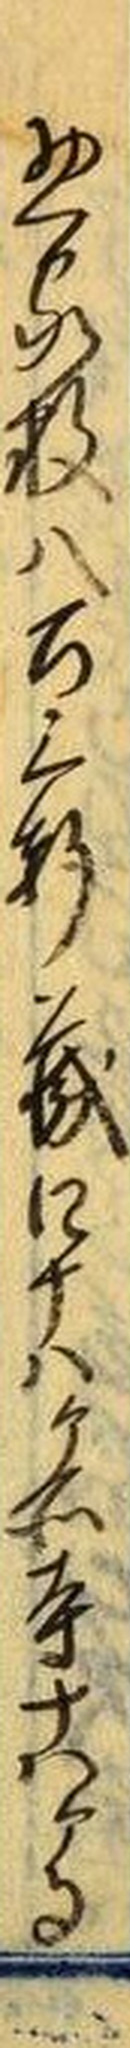惣家数ハ百三軒蔵四十八ヶ所寺十八ヶ寺
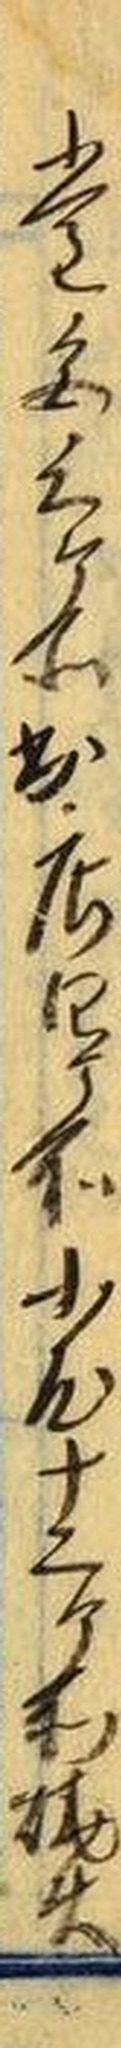堂宮三ヶ所出店四ヶ所小屋十二ヶ所焼失

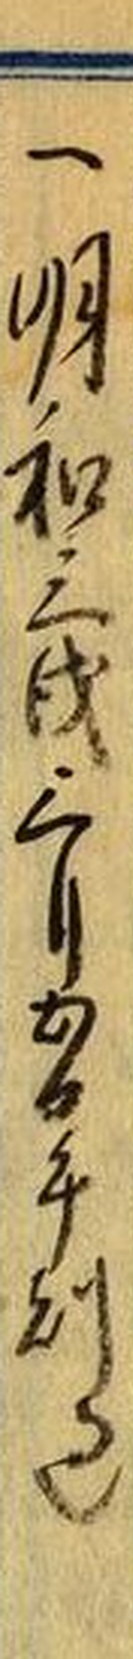一明和三戌三月五日午刻過
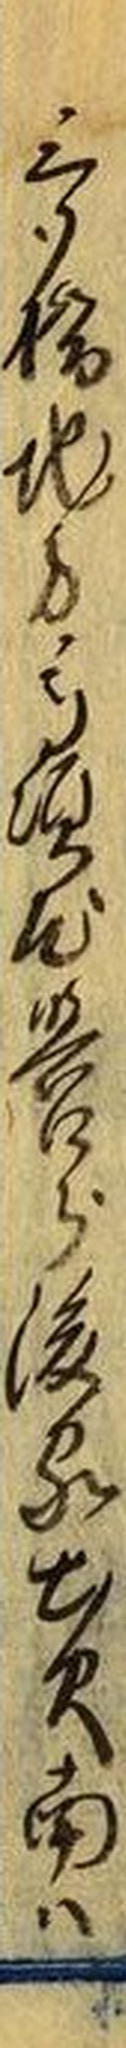三ッ橋地方高須屋豊四郎後家出火南ハ
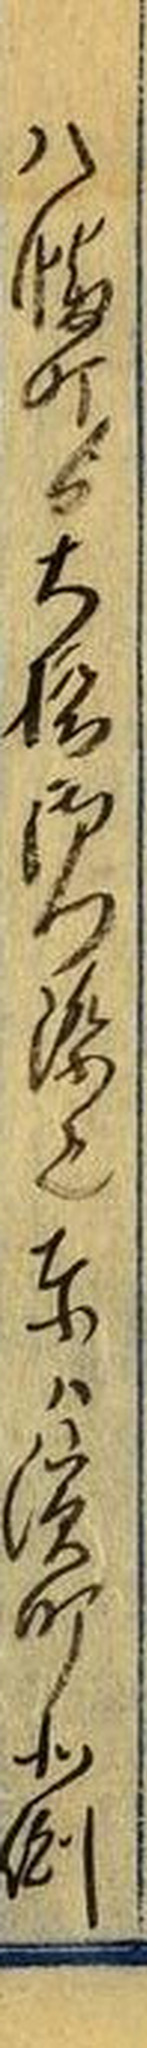八幡町ゟ大橋御門際迄東ハ浜町北側
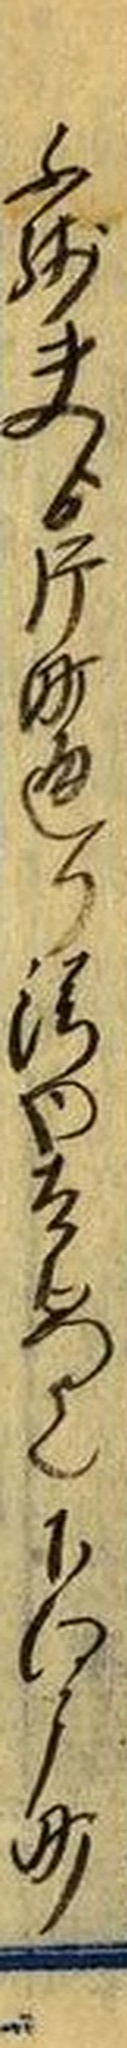不残夫ゟ片町通り清や太右衛門迄下江戸町
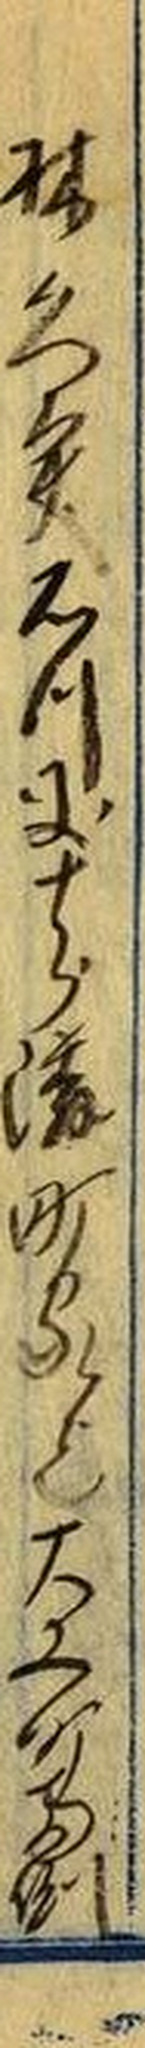林久太夫石川半十郎隣町家迄大工町両側
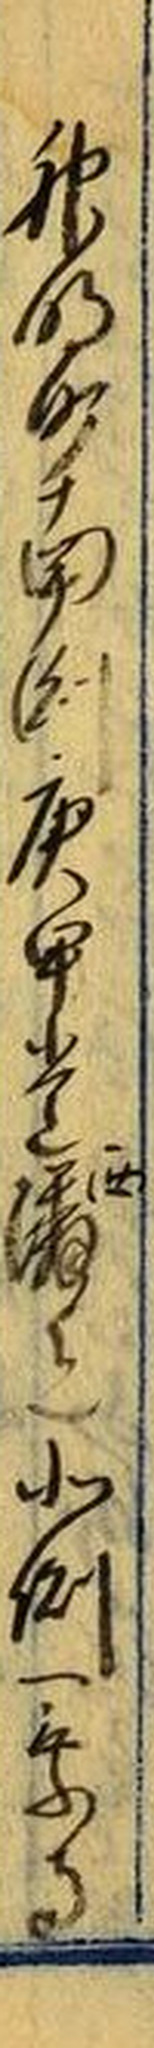神明町南側庚申堂西隣迄北側一乗寺
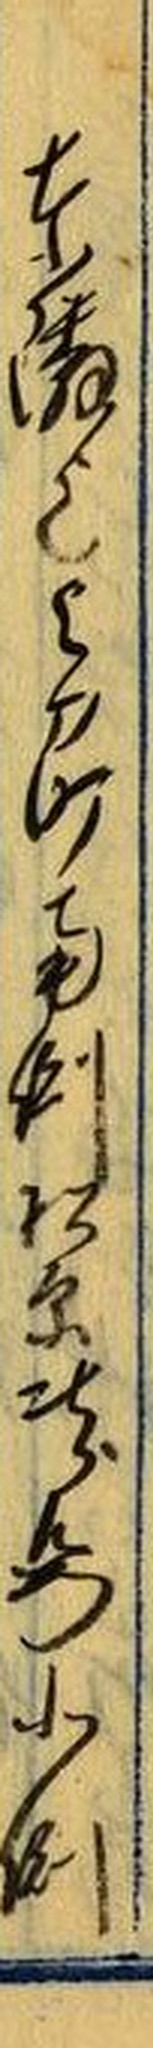東隣迄与部町南側松原次郎左衛門北側
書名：温古集 五巻
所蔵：福井県文書館 Fukui Prefectural Archives
